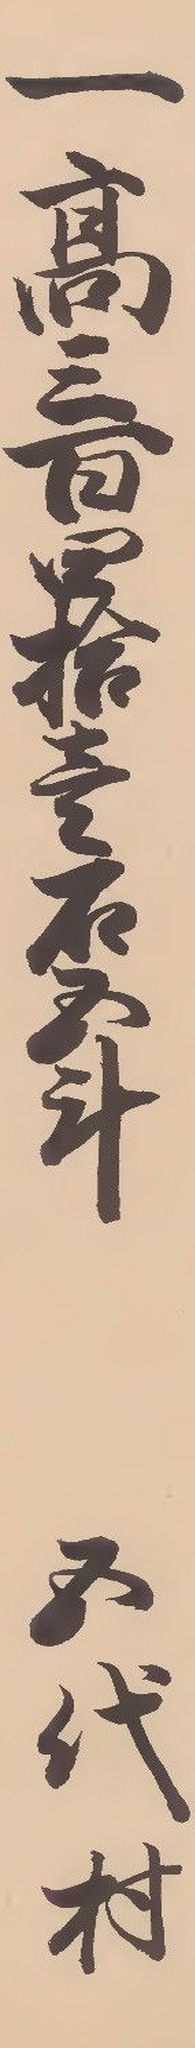一高三百四拾壱石五斗五代村
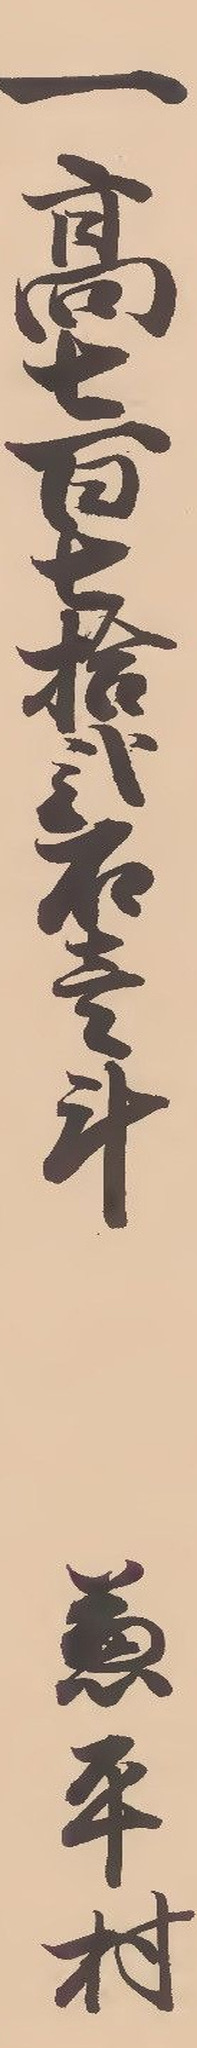一高七百七拾弐石壱斗兼平村
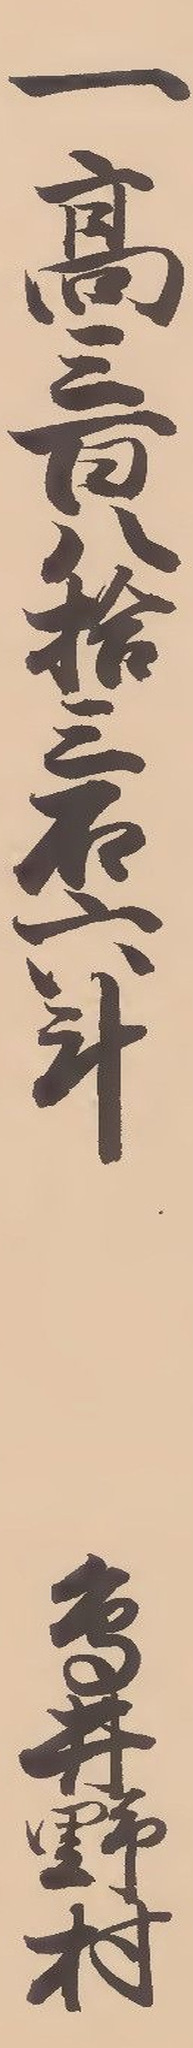一高三百八拾三石六斗鳥井野村
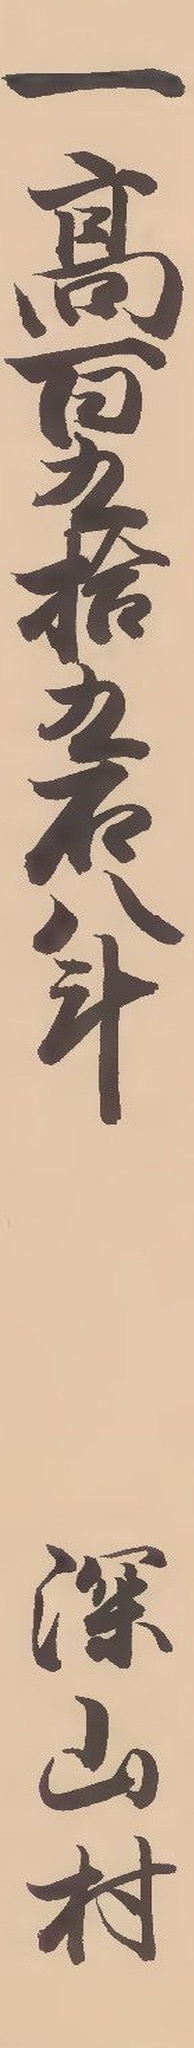一高百九拾九石八斗深山村

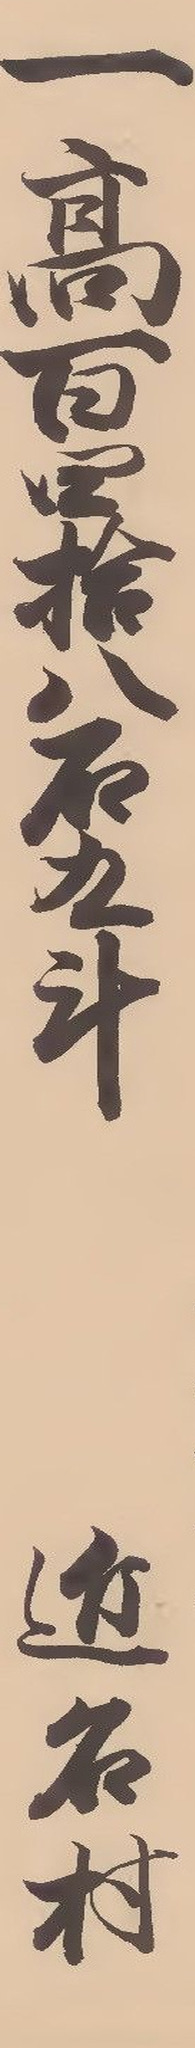一高百四拾八石九斗近名村
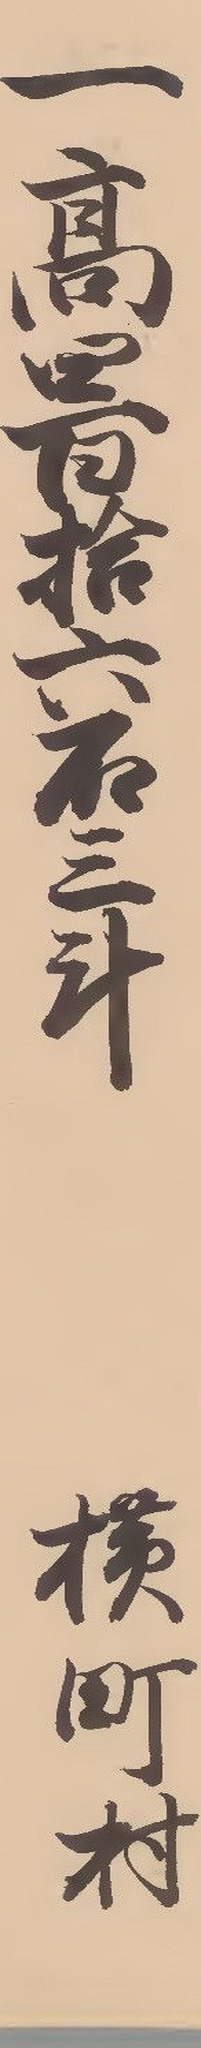一高四百拾六石三斗横町村
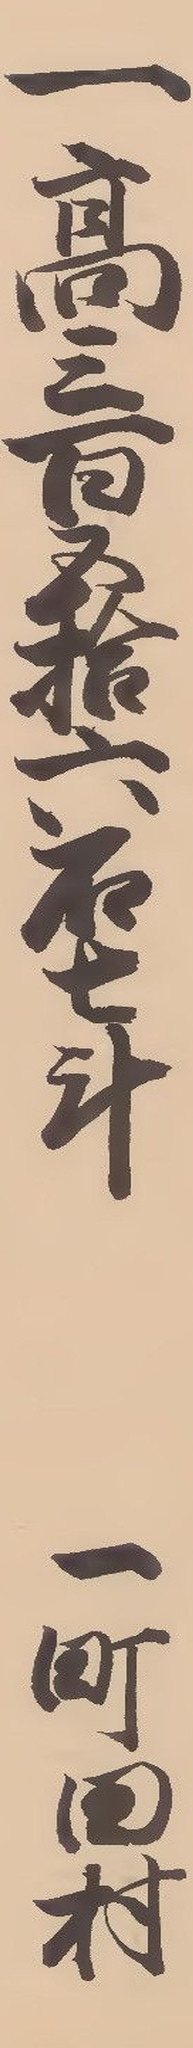一高三百五拾六石七斗一町田村
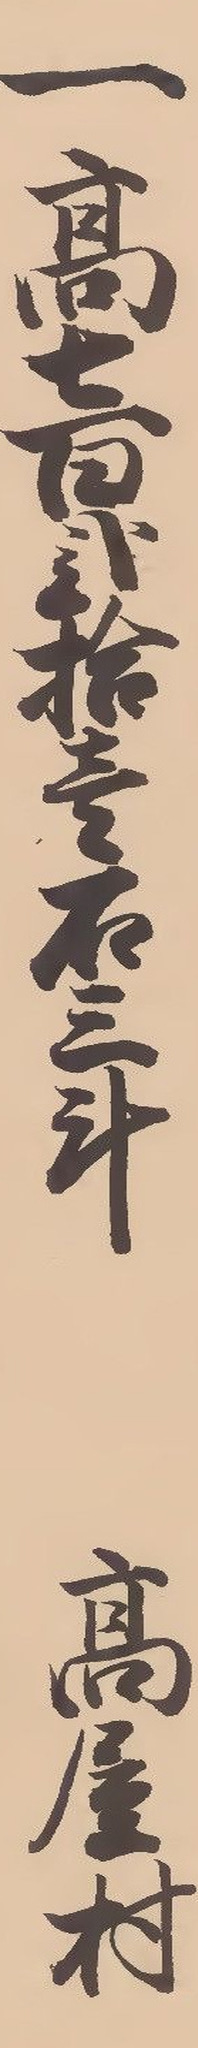一高七百弐拾壱石三斗高屋村
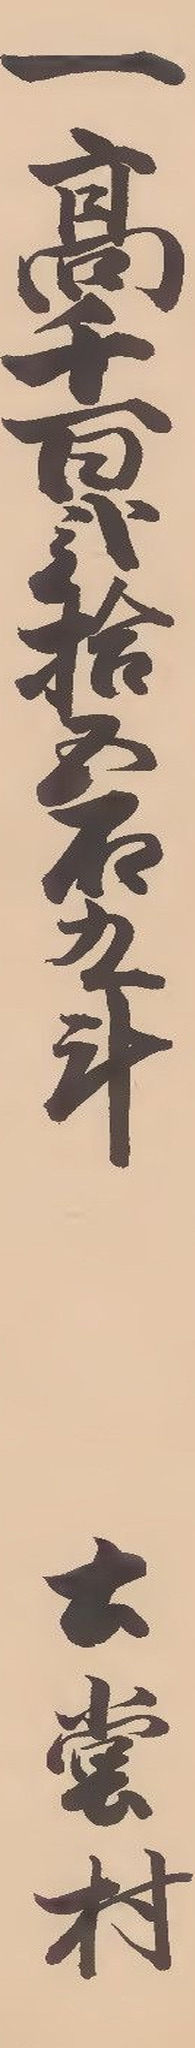一高千百弐拾五石九斗土堂村
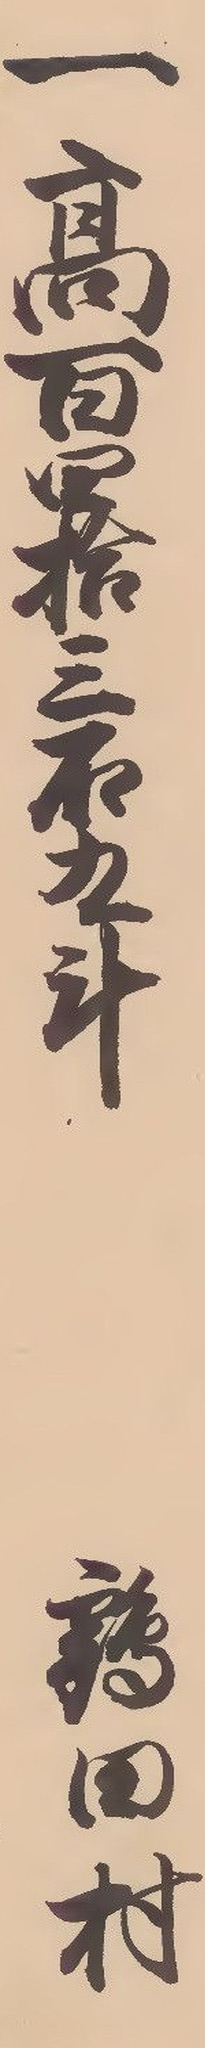一高百四拾三石九斗鶴田村

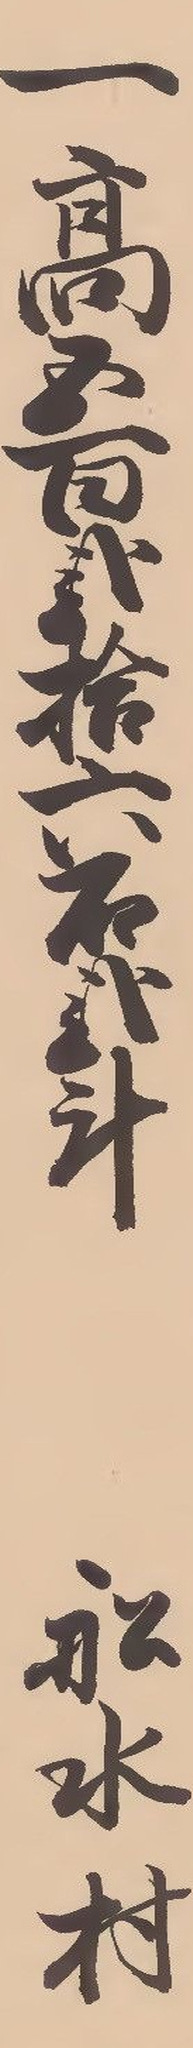一高五百弐拾六石弐斗船水村
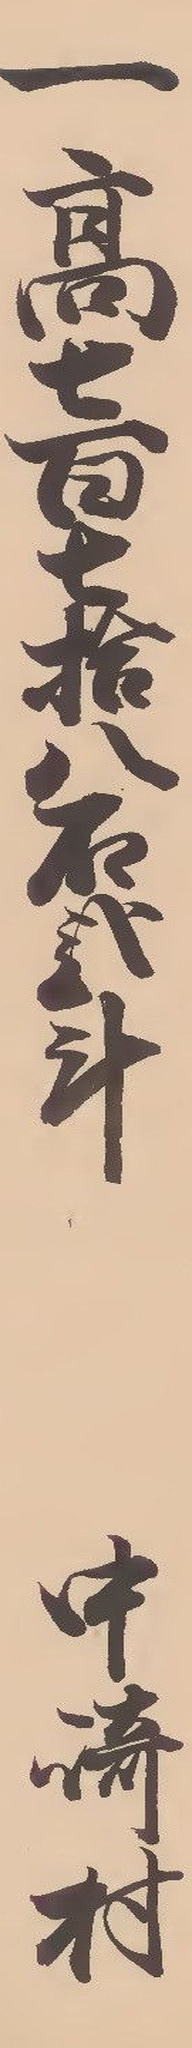一高七百七拾八石弐斗中崎村

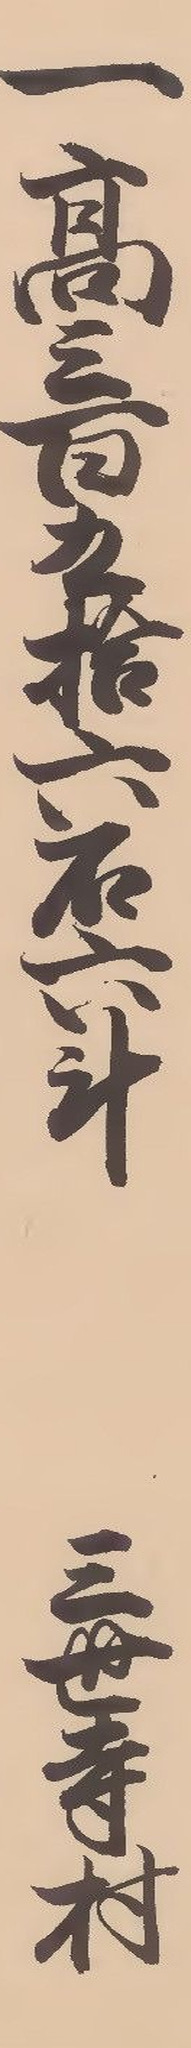一高三百九拾六石六斗三世寺村
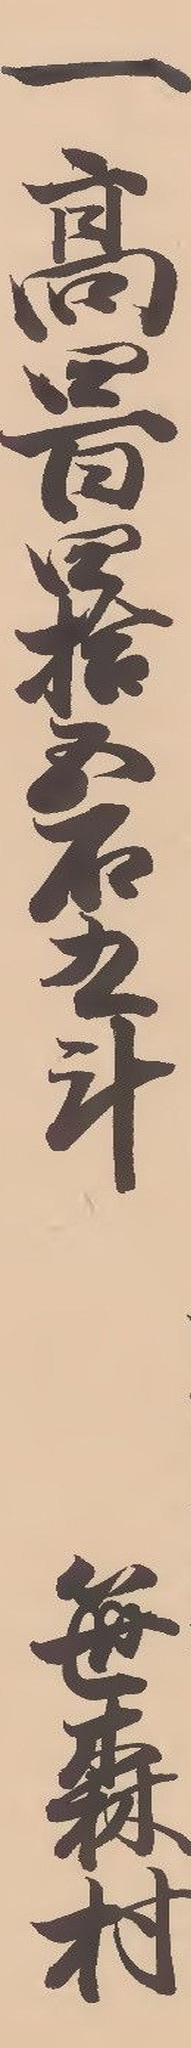一高四百四拾五石九斗笹森村
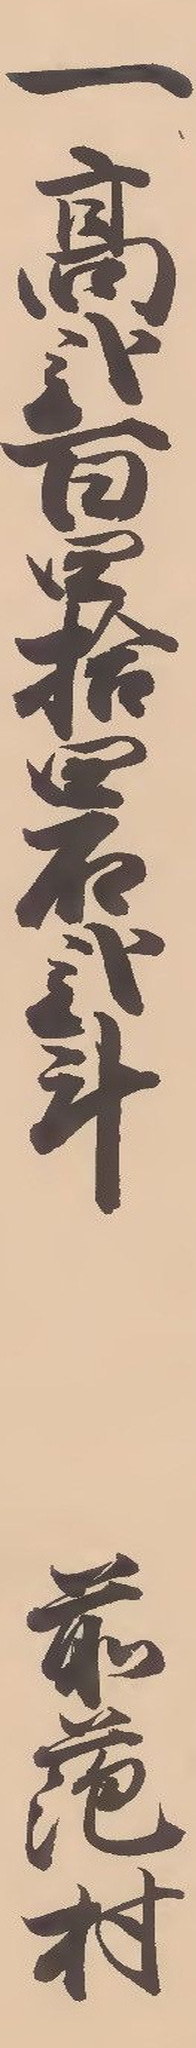一高弐百四拾四石弐斗前萢村
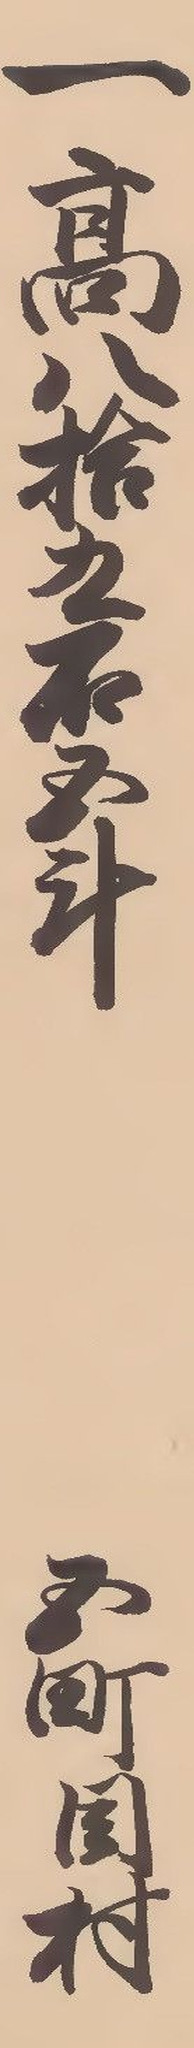一高八拾九石五斗五町目村
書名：陸奥国郷帳　７
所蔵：国立公文書館 National Archives of Japan
